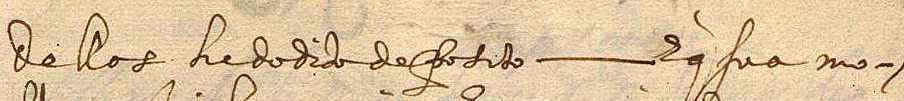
dellas he do dito deposito E q̄ sua mo
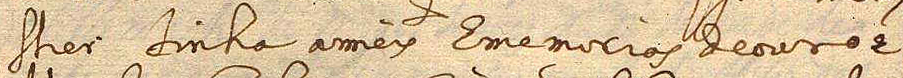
lher tinha anneis E memorias de ouro Ē
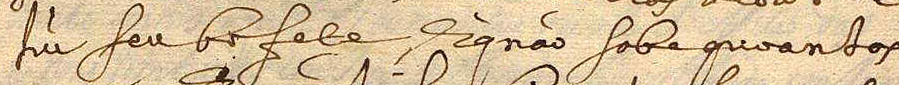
hū seu bofete, E q̄ não sabe quoantos
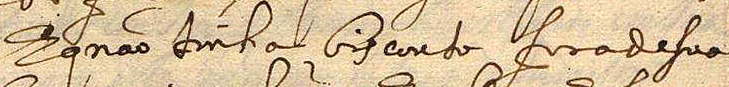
E q̄ não tinha biscouto fora de sua
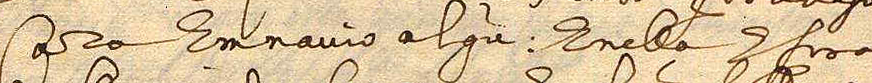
Caza Em nauio algū: E nella E fora
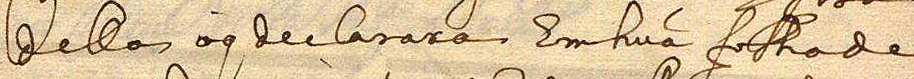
della o q̄ declarara Em huā folha de
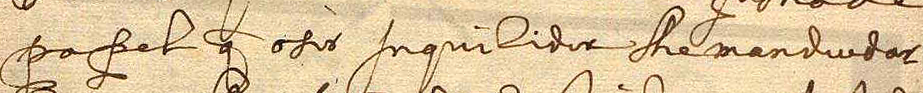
papel q̄ o sor̄ Jnquizidor lhe mandou dar
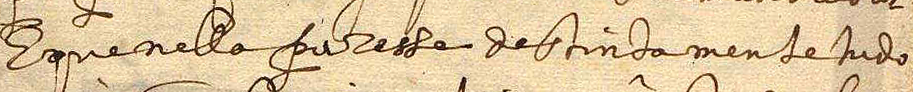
E que nella puzesse destintamente tudo
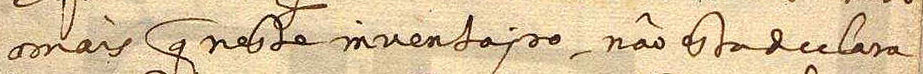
o mais q̅ neste inuentajro não esta declara
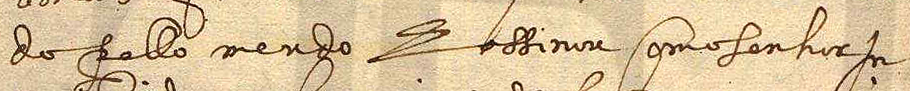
do pello meudo E assinou Com o senhor Jn
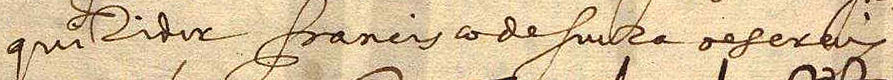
quizidor francisco de souza o escreuj
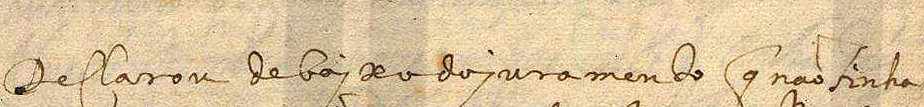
DeClarou debajxo do juramento q̄ naõ tinha
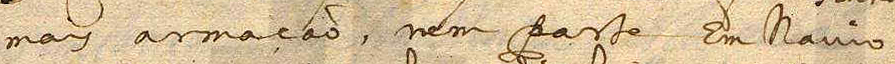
mais armação, nem parte Em Nauio
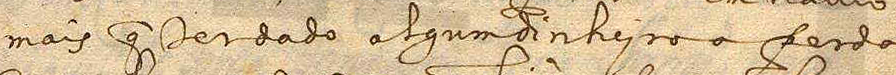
mais q̄ ter dado algum dinhejro a perda
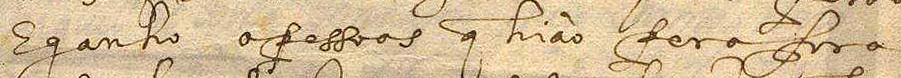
E ganho a pessoas q̄ hiãoaõ pera fora
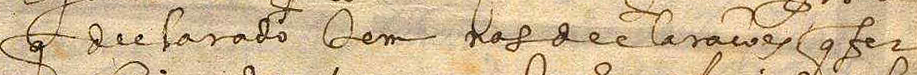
q̄ declarado tem nas declarações q̄ fez
